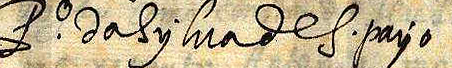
P.o da sylua de s. payo
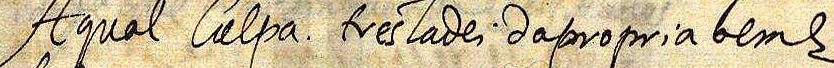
A qual Culpa tresladei da propria bem E
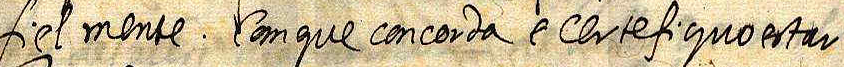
fielmente . Com que concorda e certefiquo estar
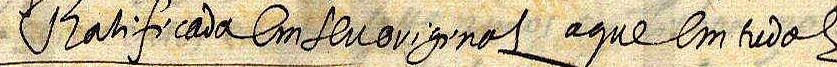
Ratificada em seu originaL a que em tudo E
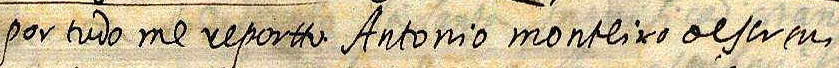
por tudo me reportto Antonio monteiro o escreui
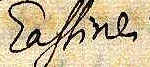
E assinei
